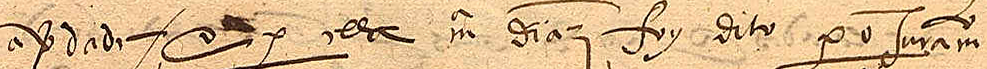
a ꝟdade / e ꝑ ella ma diaz foy dito ꝑ o Juramto
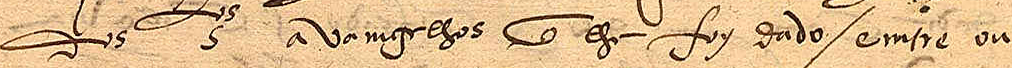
dos stos avamgelhos q̄ lhe foy dado / emtre ou
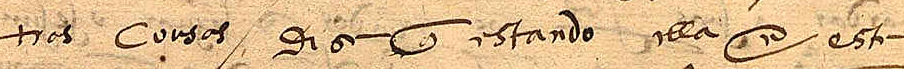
tras Cousas / dise q̄ estando ella ē este
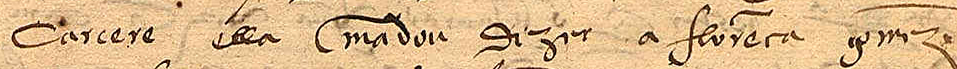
Carcere ella m̄adou dizer a florēca gomez
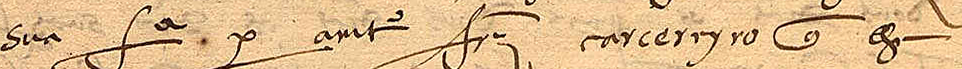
sua fa ꝑ amto fr̄z carcereyro q̄ lhe
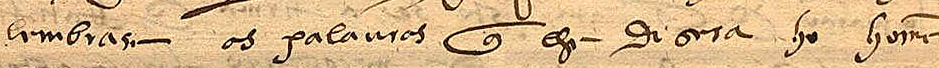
lembrase as palauras q̄ lhe disera ho homē
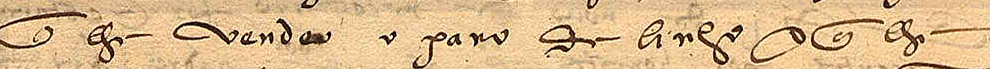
q̄ lhe vendeo o pano de linho e q̄ lhe
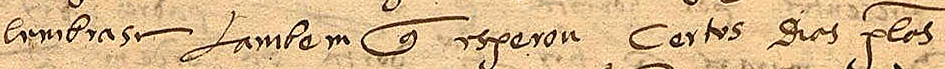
lembrase tambem q̄ esperou certos dias p̄las
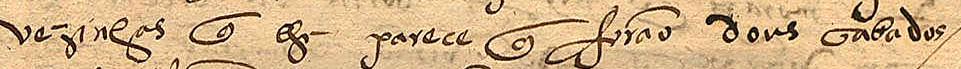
vezinhas q̄ lhe parece q̄ forão dous sabados/
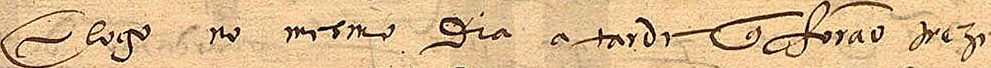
E logo no mesmo dia a tarde q̄ forão treze
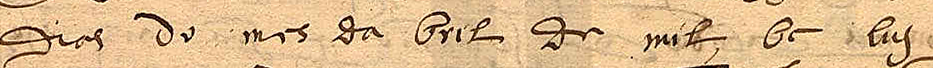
dias do mes da bril de mil bc liij
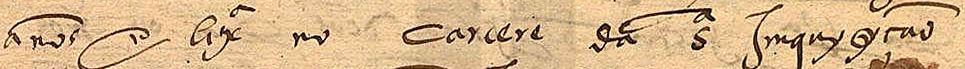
an̄os ē lixa no Carcere da sta Jmquysyção
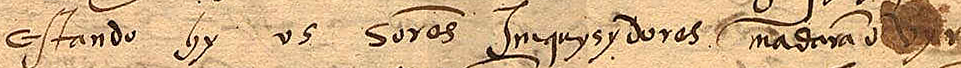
Estando hy os Sōres Jmquysydores m̄adarão vyr
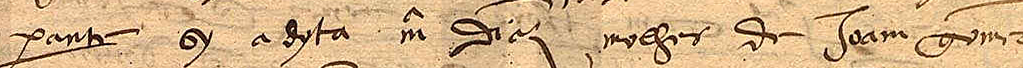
ꝑante sy a dyta ma diaz molher de Joam gomez
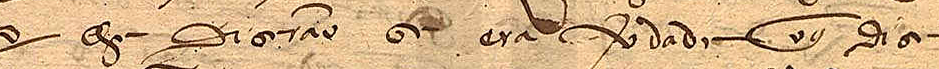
e lhe dyserão se era ꝟdade o q̄ dise
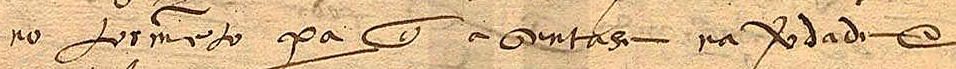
no torm̄eto ꝑa q̄ asentase na ꝟdade e
